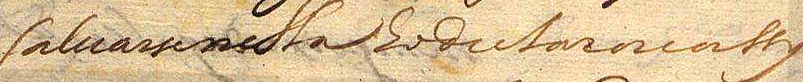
saluarse nella E o declarou assy
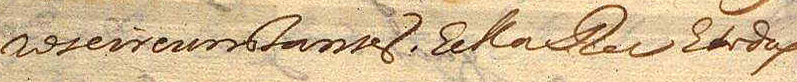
aos circunstantes. E ella Ree E todas
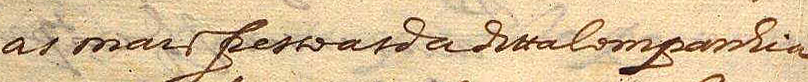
as mais pessoas da ditta companhia
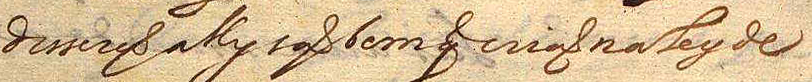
disseraõ ally taõbem q̄ criaõ na Ley de
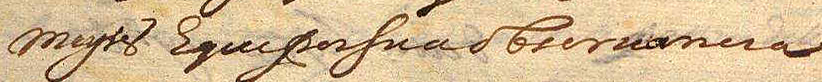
moyses E que por sua obseruancia
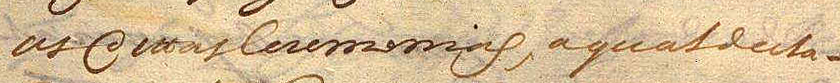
as dittas ceremonias, a qual decla
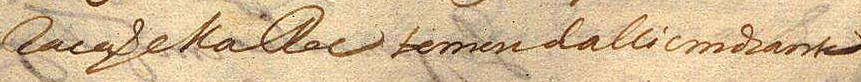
Racaõ ella Ree tornou dalli em diante
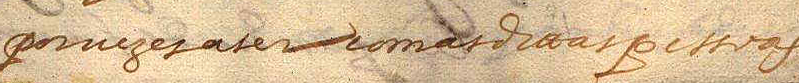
por uezes a ter com as dittas pessoas
